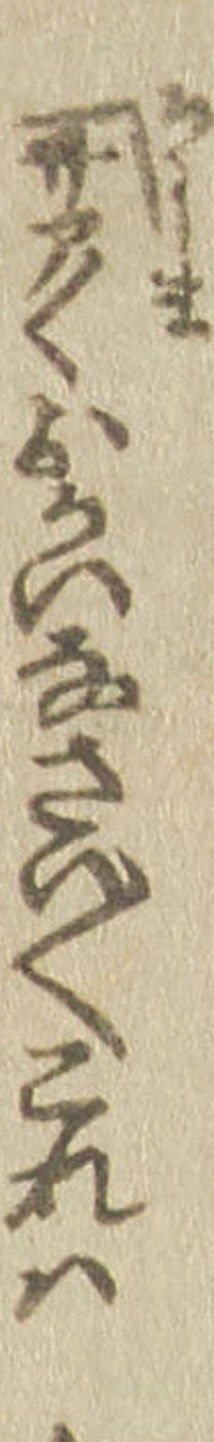「さあ〳〵おかいなさい〳〵これは
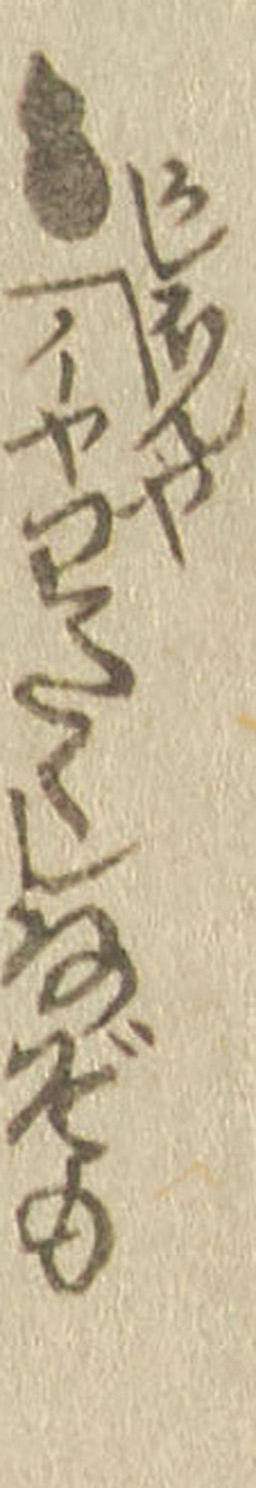「いやわたしなぞも
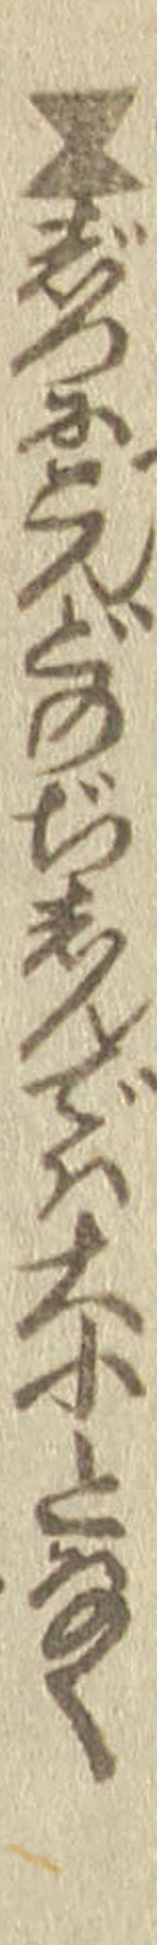「じつにこんどのぢしんでは大小となく
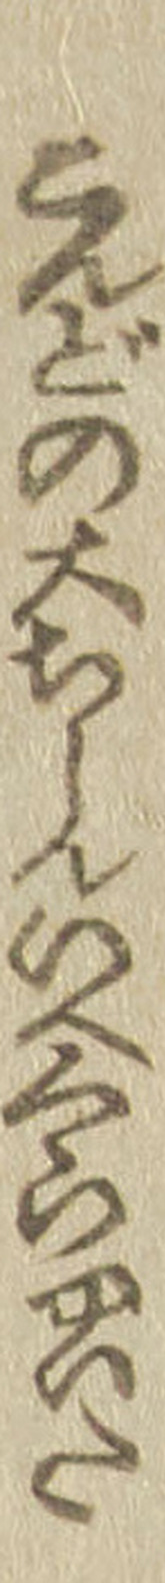こんどの大ちしんいへくらやいた
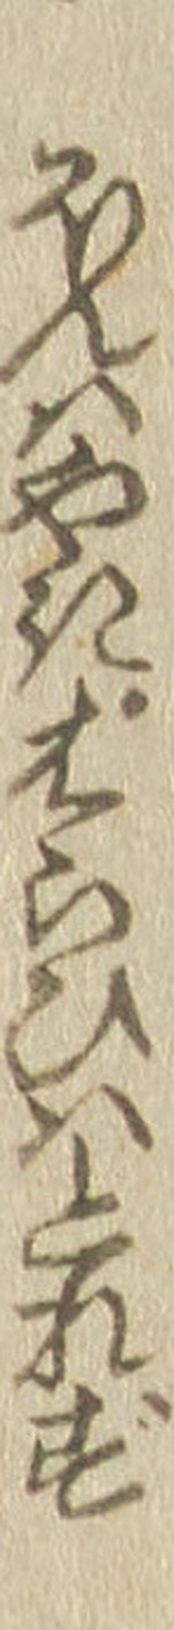ほんはやきはらひはとれず
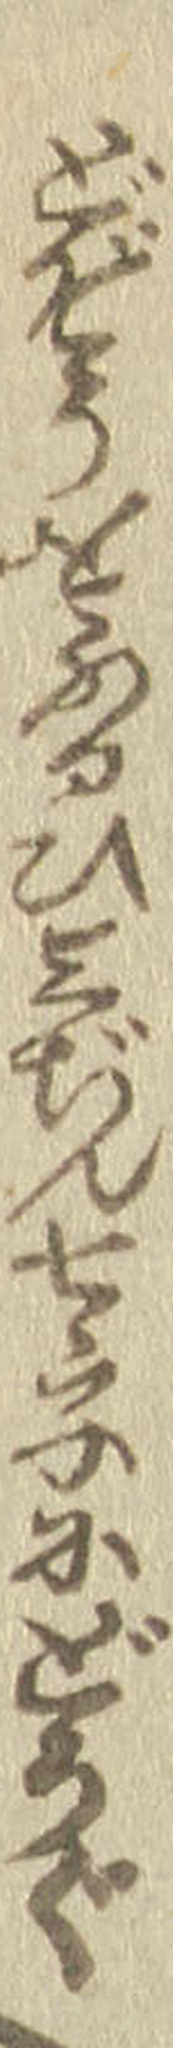どぞうをふるひみぢん七字？にどうぐ
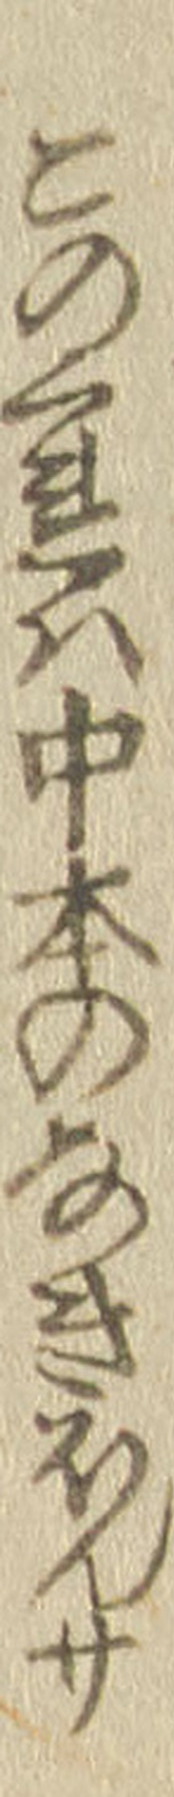このくれは中本のなきほんさ
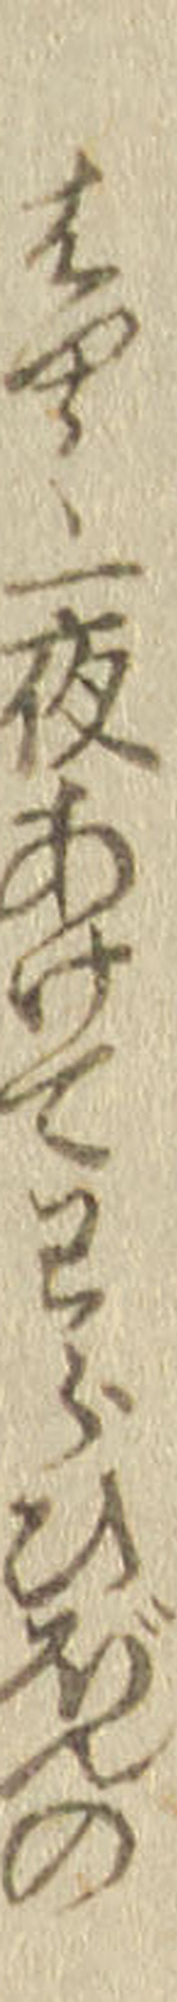はやく一夜あけてわらひぼんの
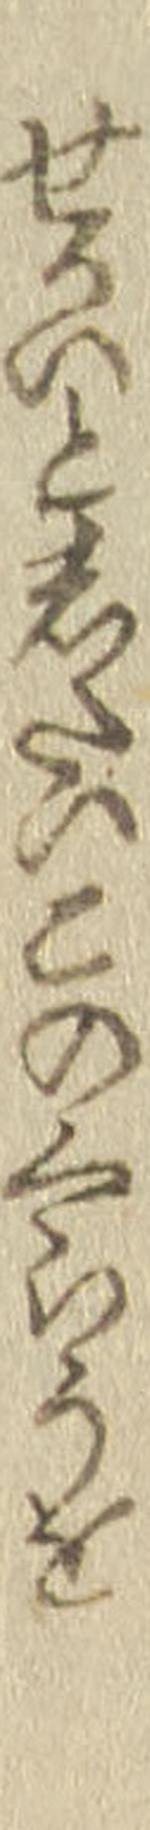せかいとしたいこのくらうを
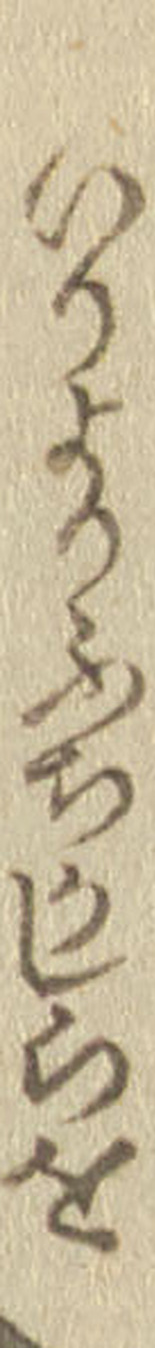いりようふちかしらを
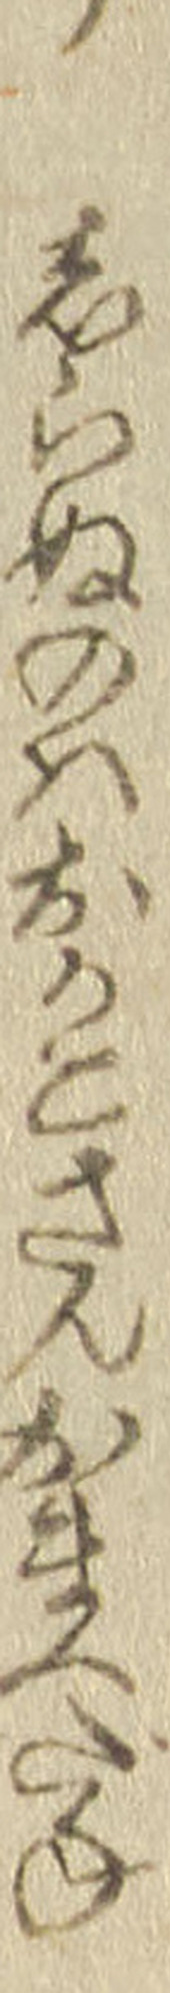しらぬのはおかこさんおまへたね
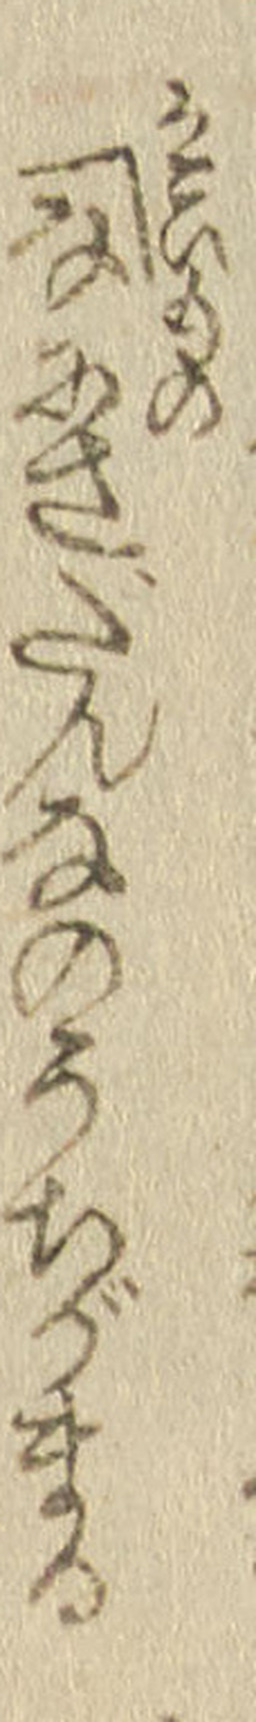「なにさたんなのうちづまる
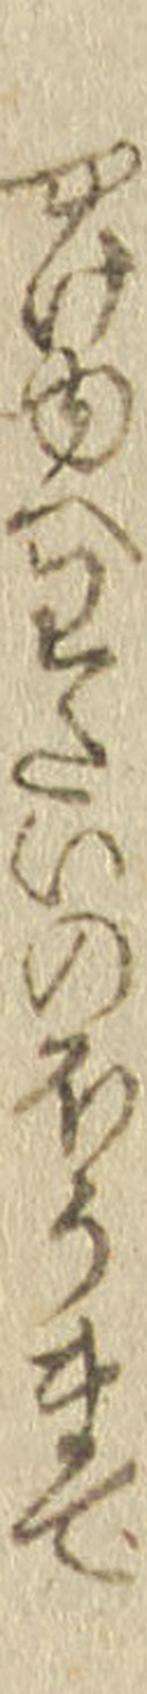やけゆへわたいのほうまで
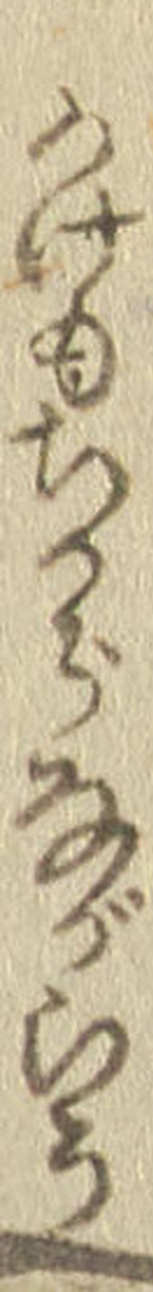かけもちからながらう
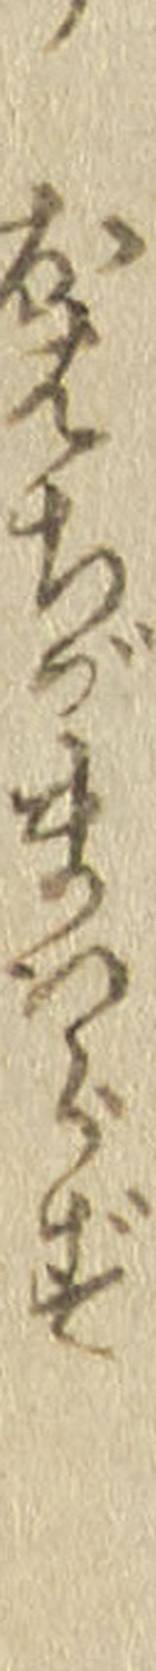おはちがまはらず
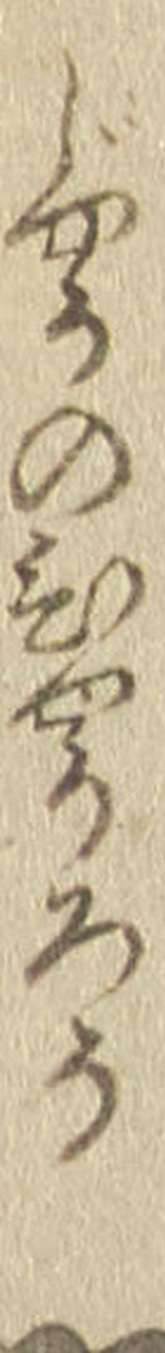じやうのひやうろう
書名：骨抜どうせうなまづ大家破焼
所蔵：東京大学総合図書館 General Library in the University of Tokyo, JAPAN
